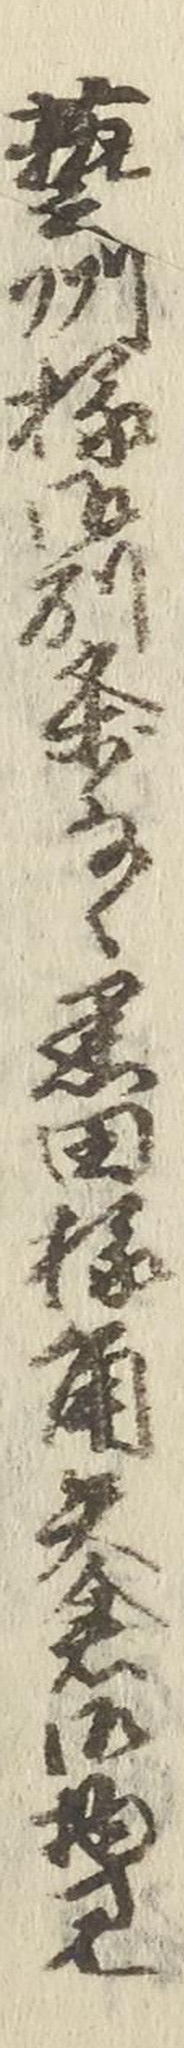芸州様御別条なく黒田様角矢倉御物見
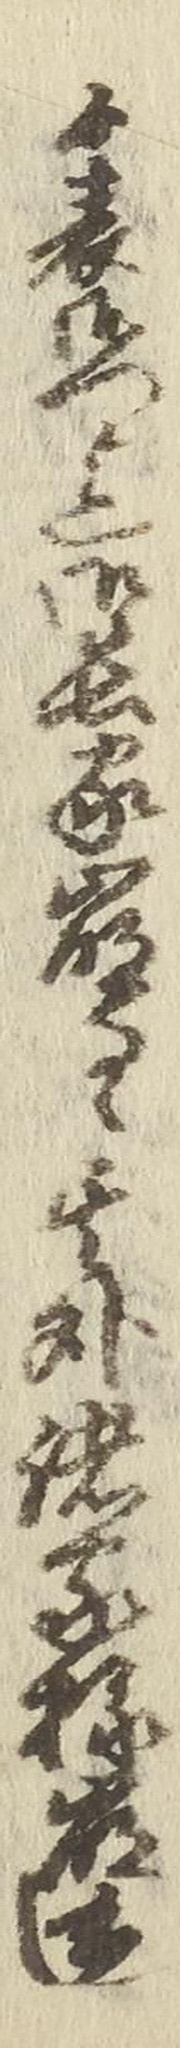ゟ表御門迄御長家崩る其外諸家様崩多し
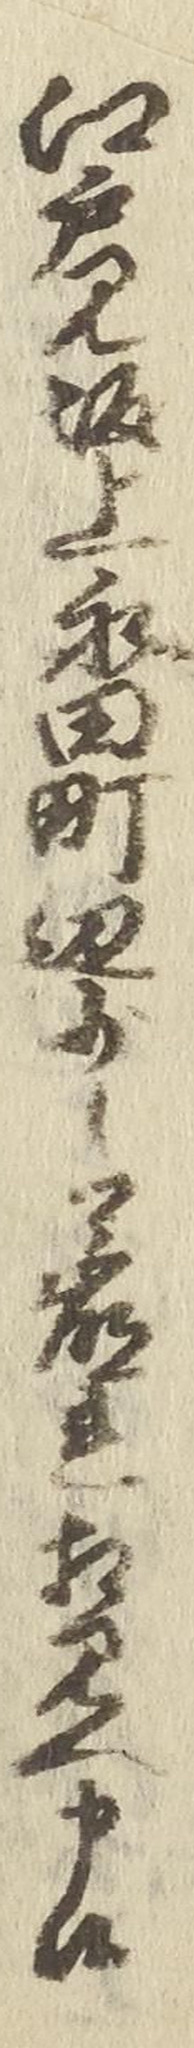江戸見坂上永田町辺少しツゝ崩れ相見へ申候
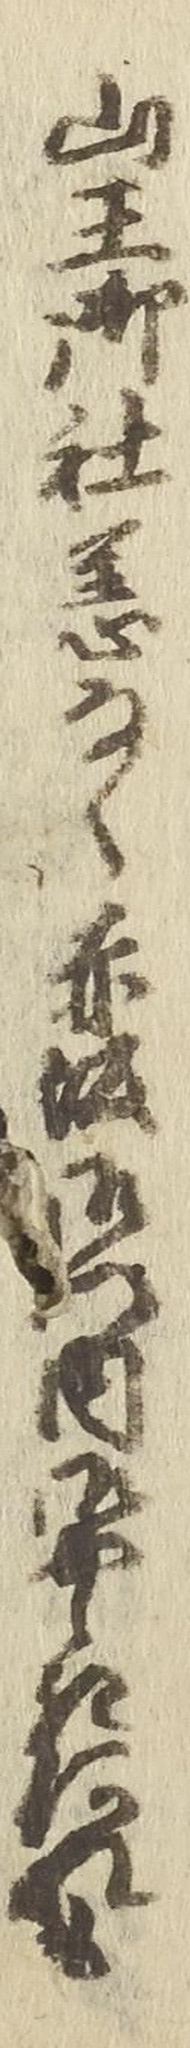山王御社恙なく赤坂御門内御やしき何れも
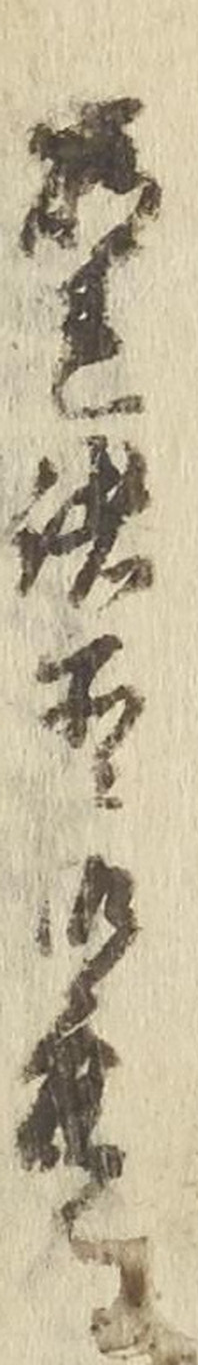崩れ諸所二御座候

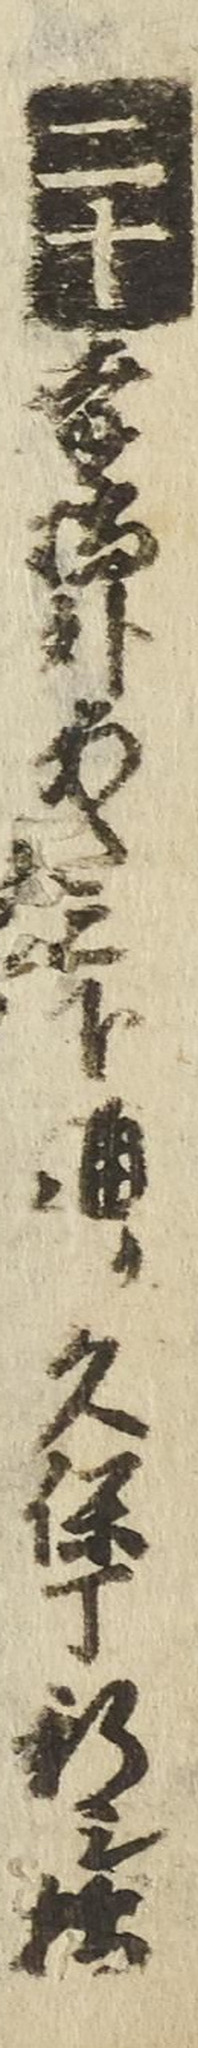二十幸橋外愛宕下通り久保丁新シ橋
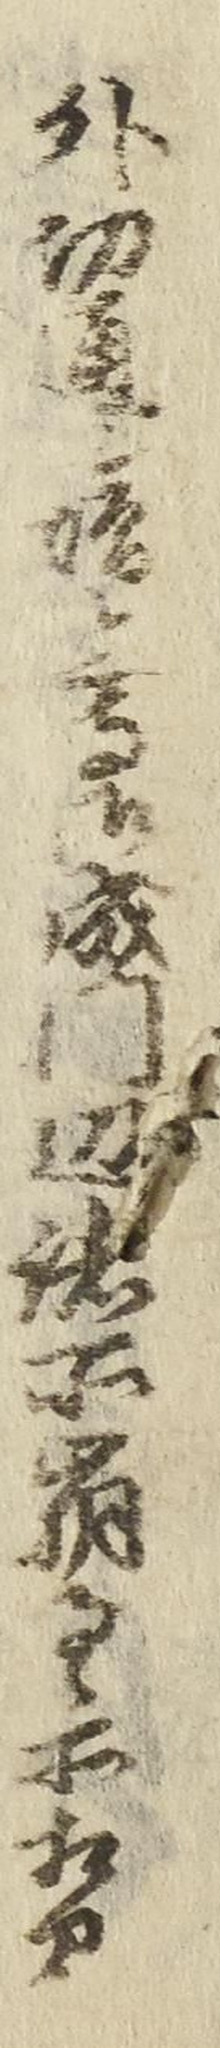外切通し増上寺御成門辺諸所崩るゝ所相見
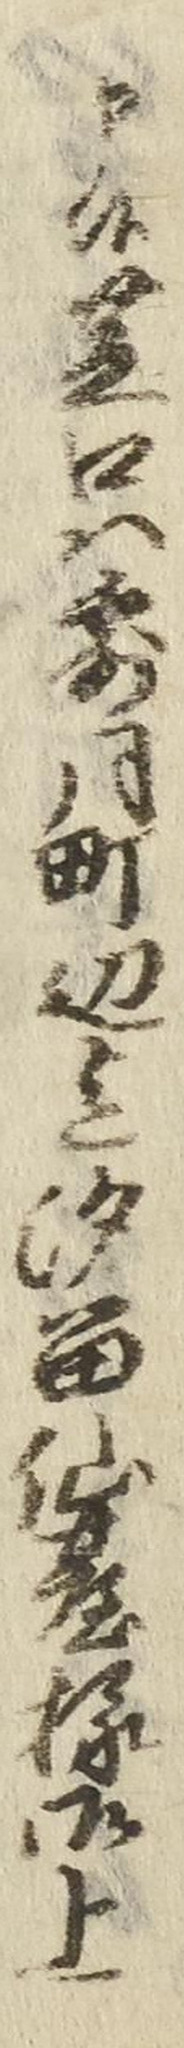申候芝口は露月帳町辺迄塩留仙台様御上
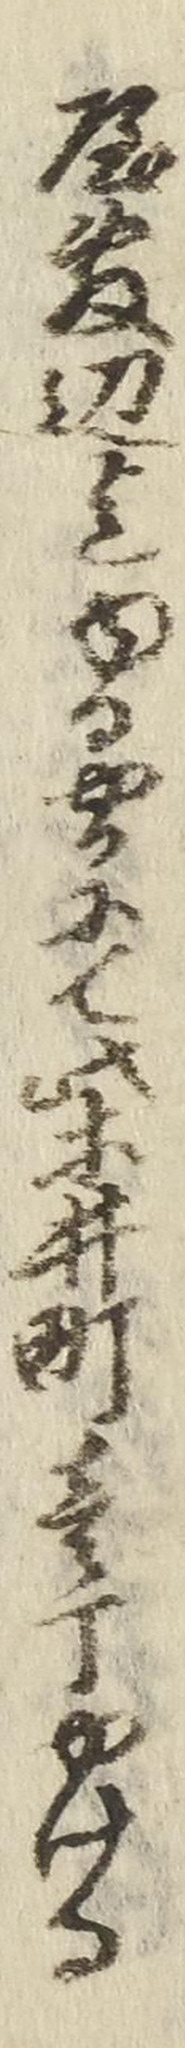屋敷辺迄ゆるやかにて柴井町壱丁やける
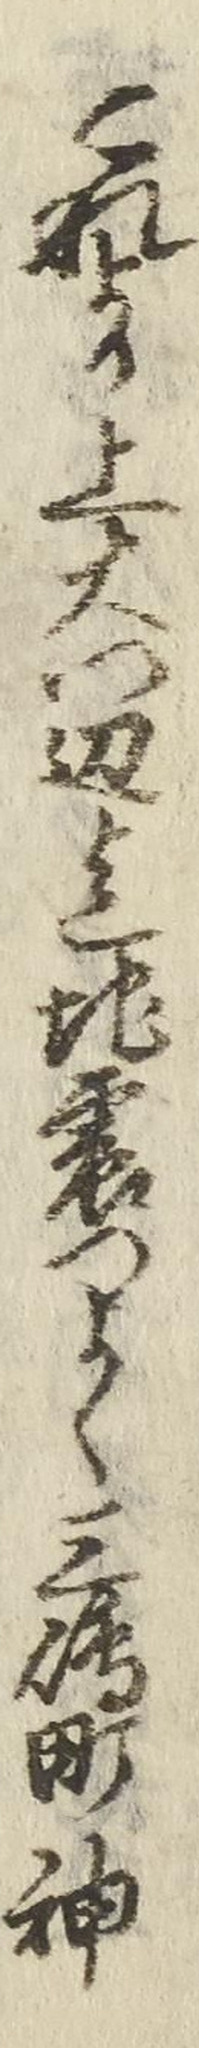これより上大門辺迄地震ちょく三嶋町神
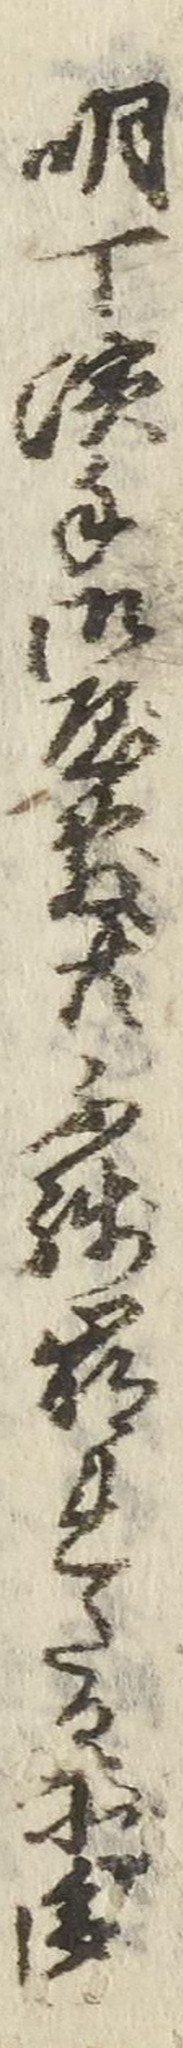明町浜手御屋敷共不残崩れたる所多し
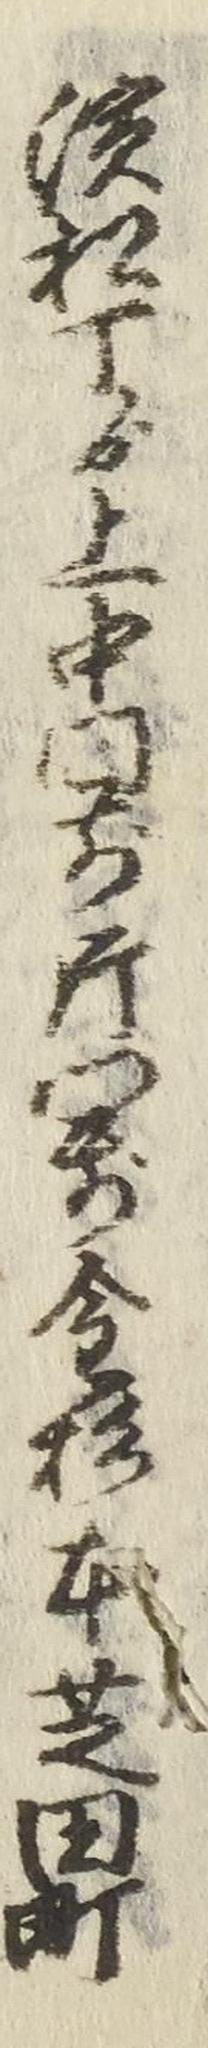浜松丁ゟ上中門前片門前金杉本芝田町
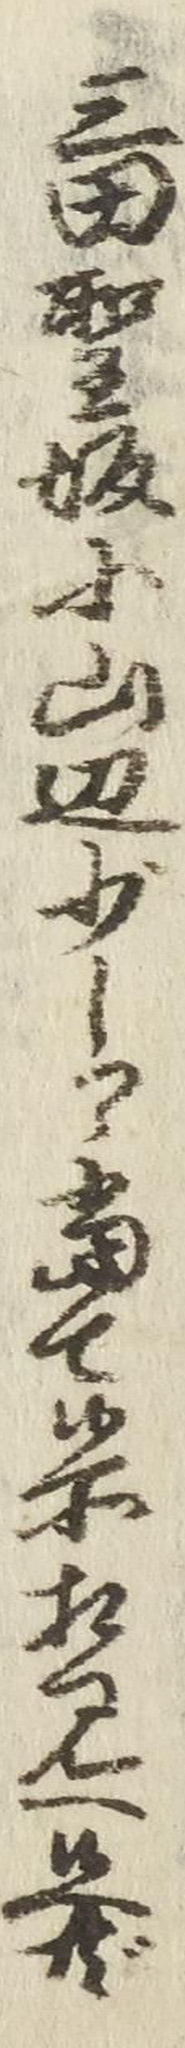三田聖坂小山辺少しツゝ当て候所相見へ候へ共
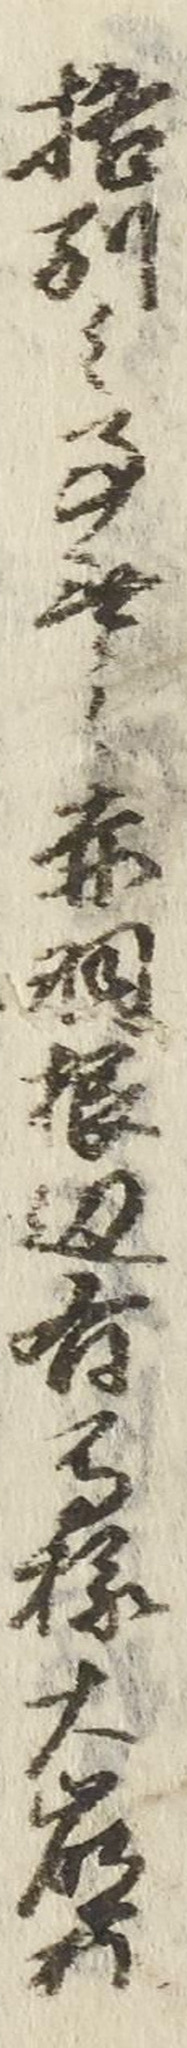格別之事無之赤羽辺有馬様大崩れ
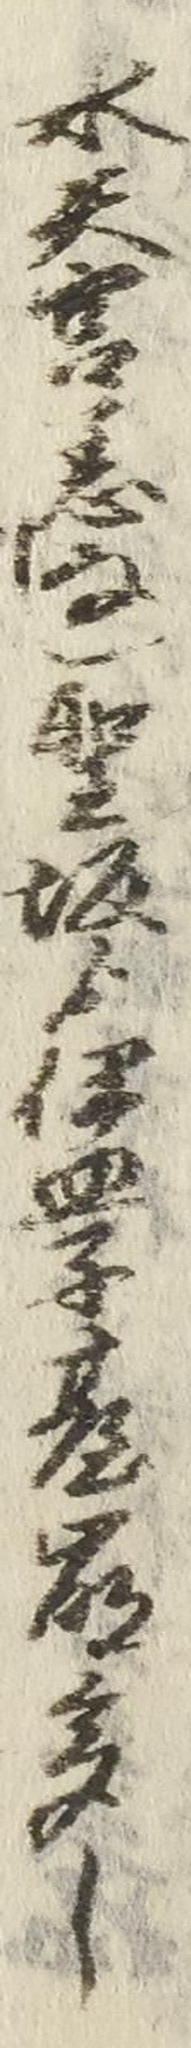水天宮恙なし聖坂ゟ伊皿子台崩多し
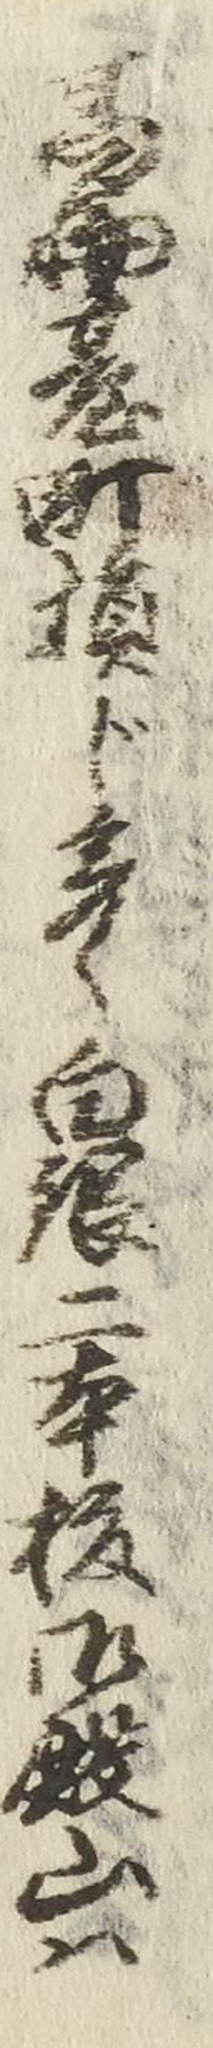高輪台町損じ多く白銀二本榎御殿山は
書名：地震出火　男女死人怪我人書上之寫
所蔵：東京大学地震研究所図書室 Earthquake Research Institute Library, The University of Tokyo, JAPAN
